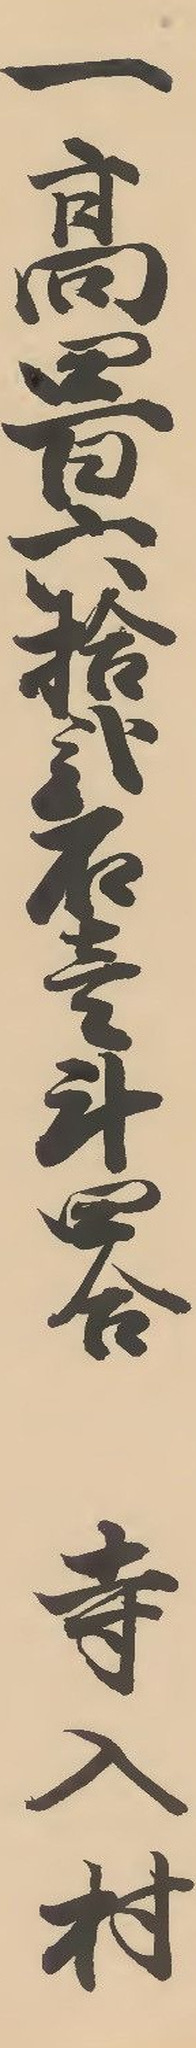一高四百六拾弐石壱斗四合寺入村
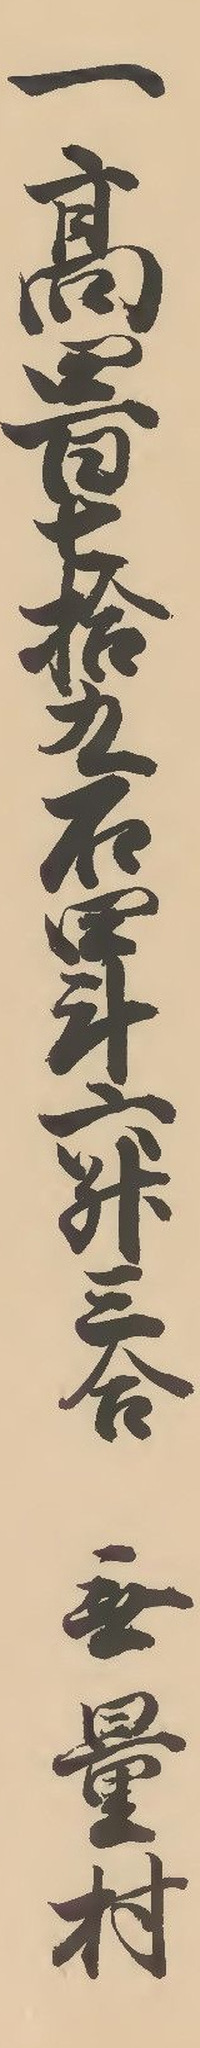一高四百七拾九石四斗六升三合無量村

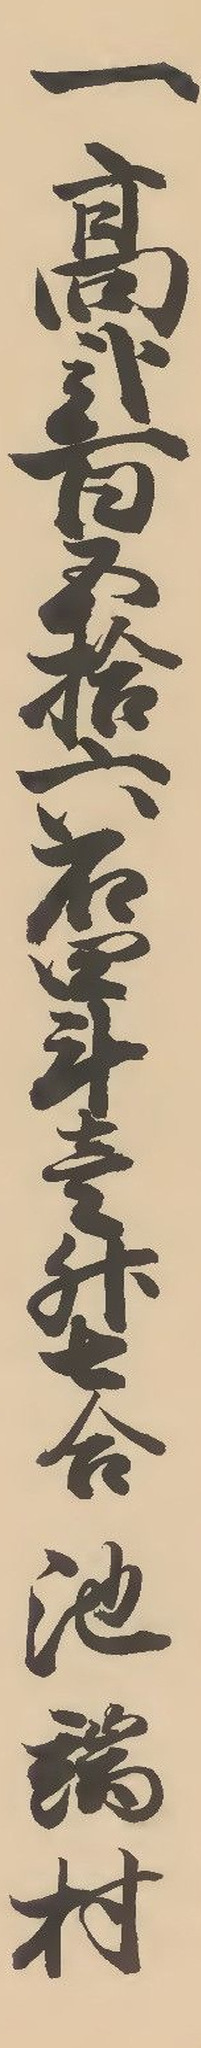一高弐百五拾六石四斗壱升七合池端村
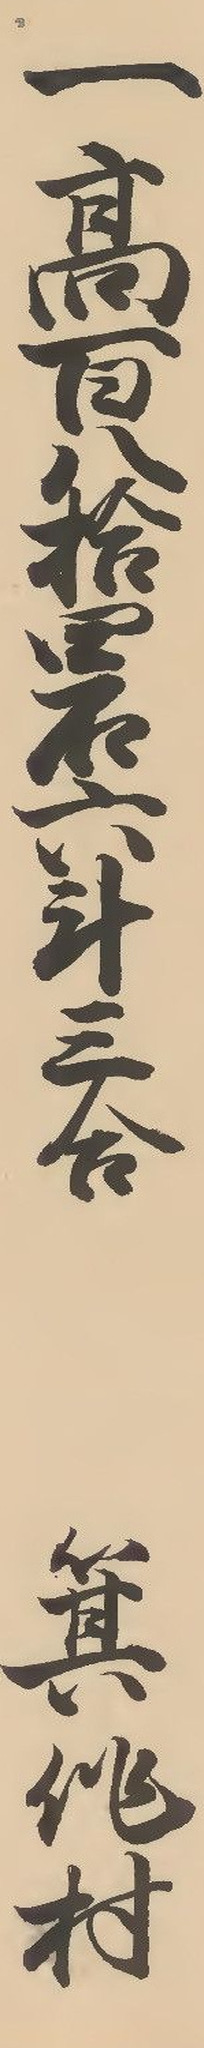一高百八拾四石六斗三合箕作村
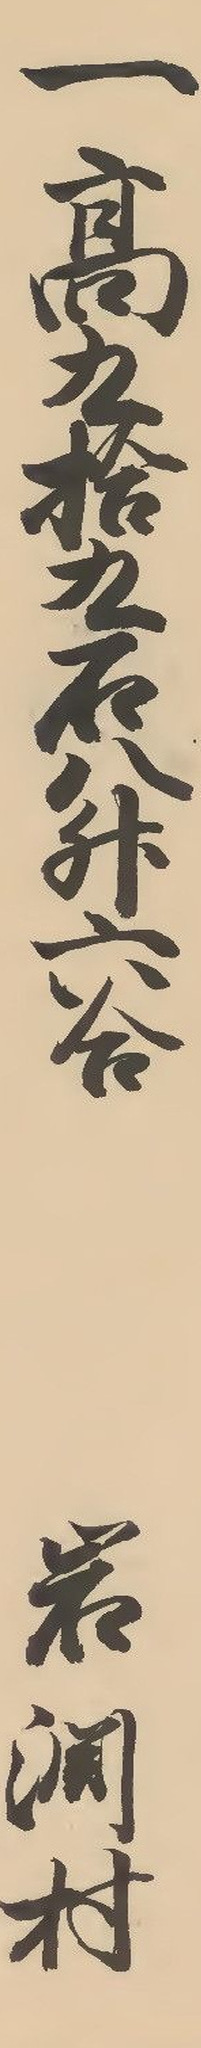一高九拾九石八升六合岩淵村
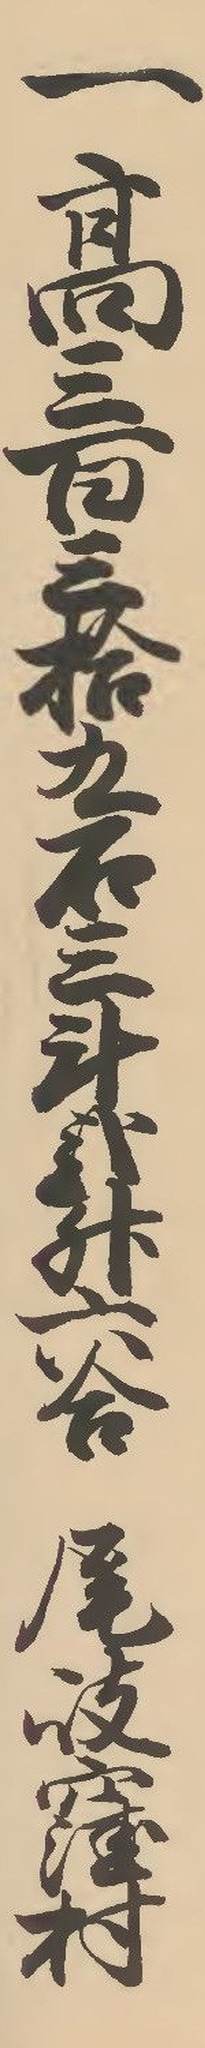一高三百三拾九石三斗弐升六合尾岐窪村
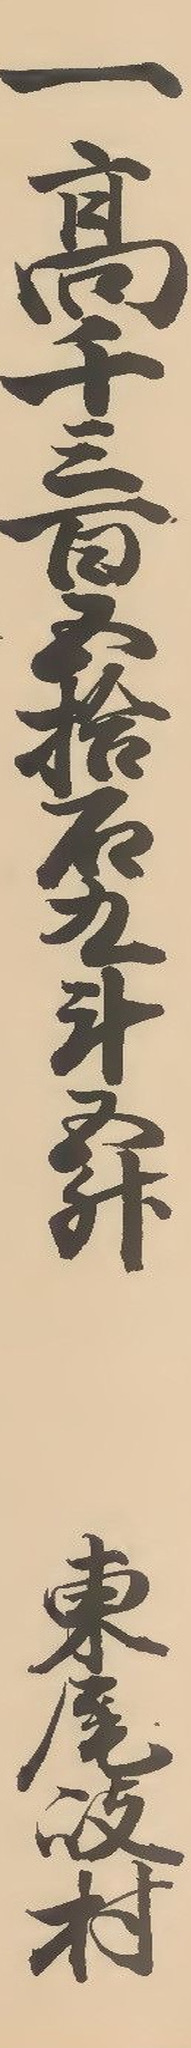一高千三百五拾石九斗五升東尾岐村
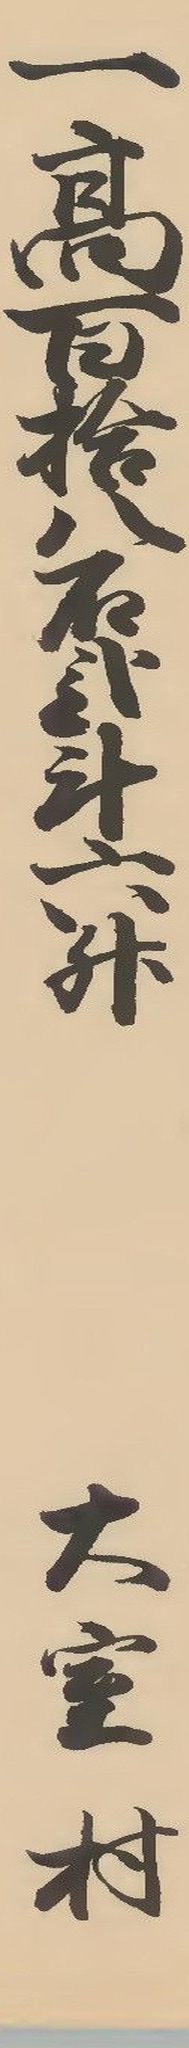一高百拾八石弐斗六升大室村
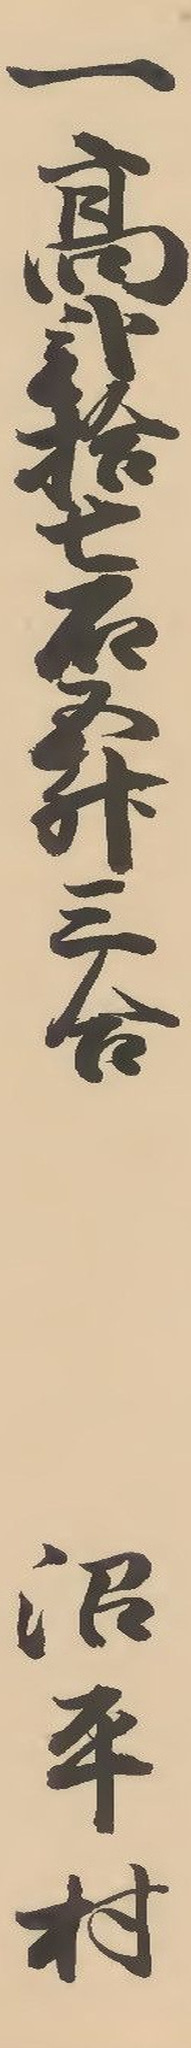一高弐拾七石五升三合沼平村
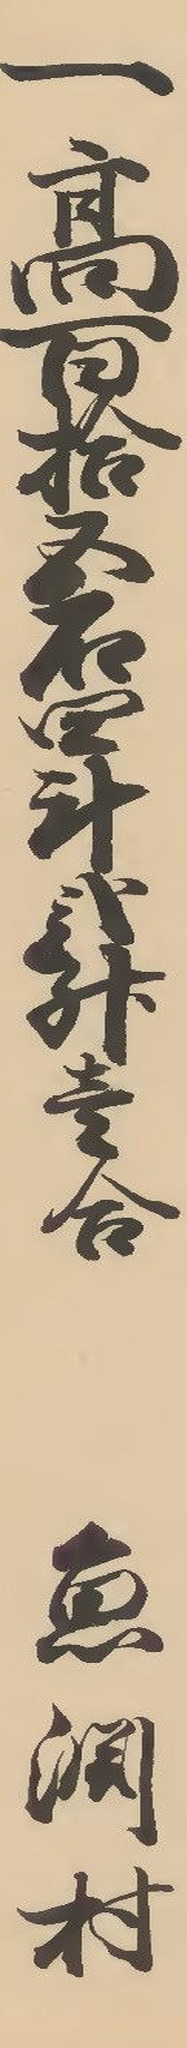一高百拾五石四斗弐升壱合魚淵村

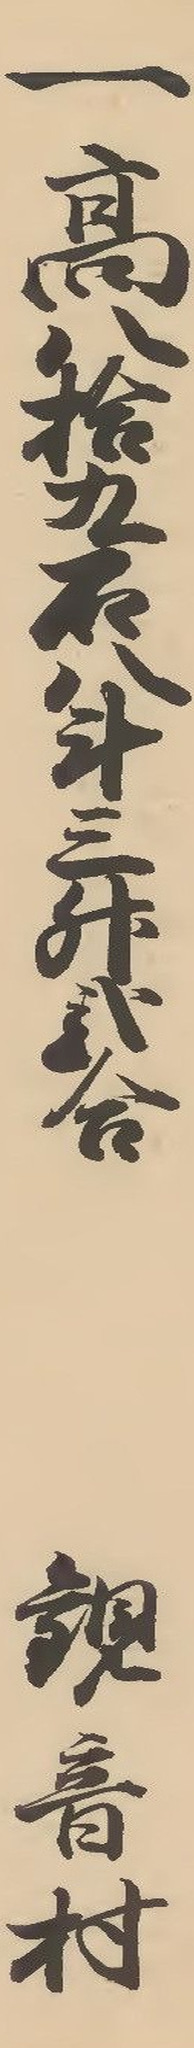一高八拾九石八斗三升弐合観音村
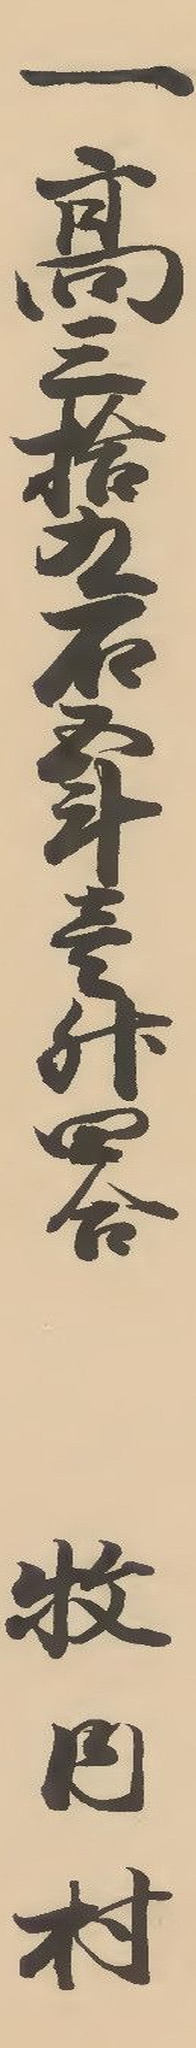一高三拾九石五斗壱升四合牧内村
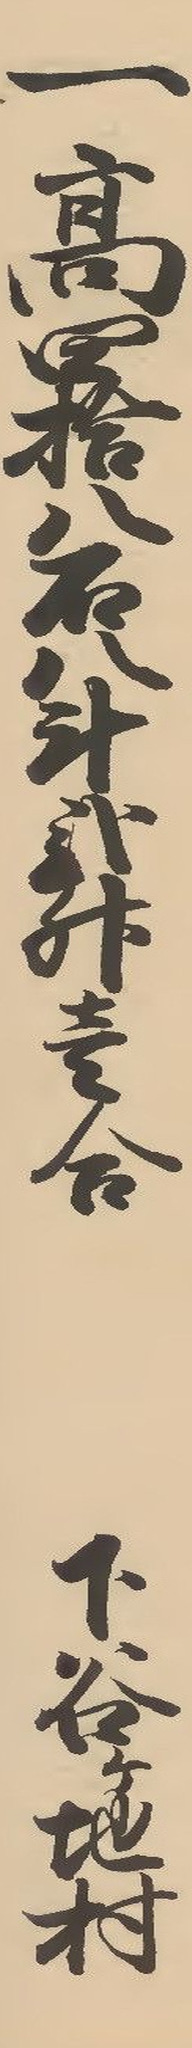一高四拾八石八斗弐升壱合下谷ヶ地村
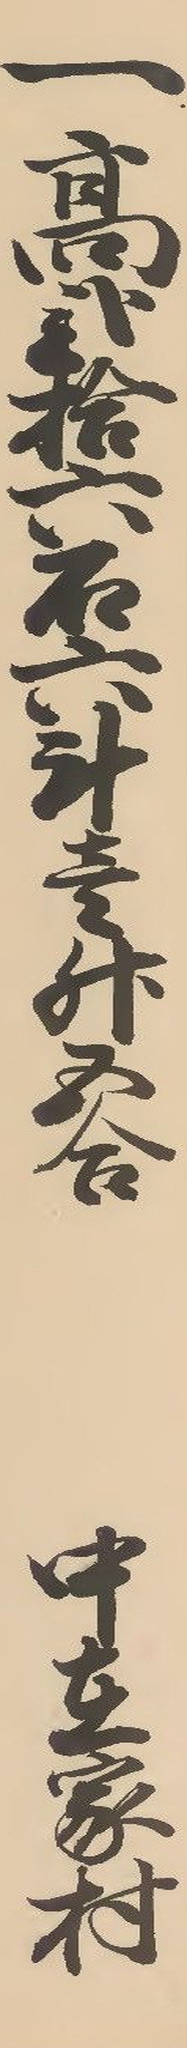一高弐拾六石六斗壱升五合中在家村
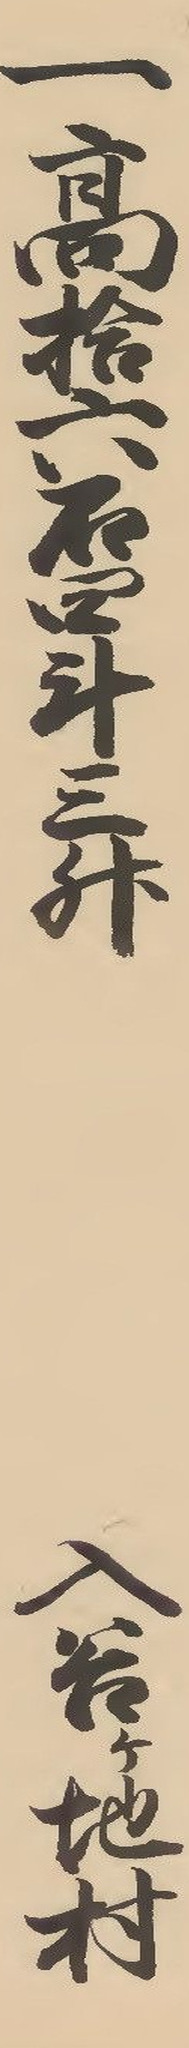一高拾六石四斗三升入谷ヶ地村
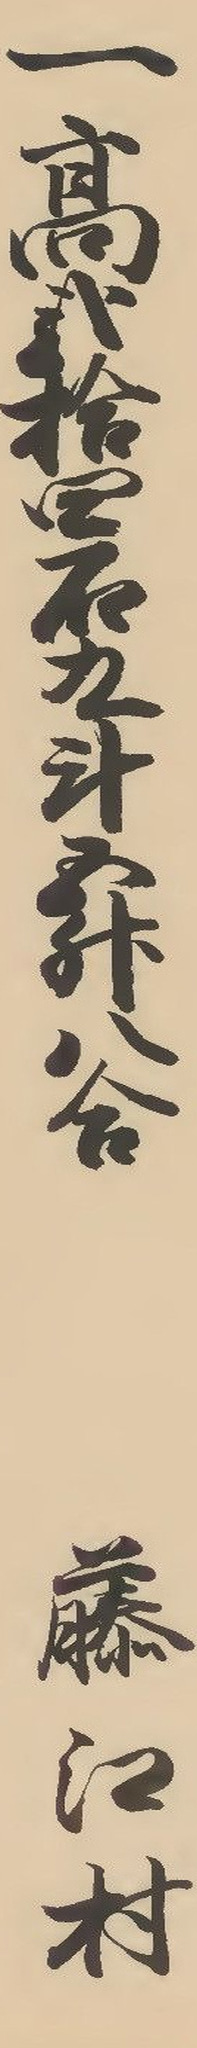一高弐拾四石九斗五升八合藤江村
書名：陸奥国郷帳　１
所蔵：国立公文書館 National Archives of Japan
